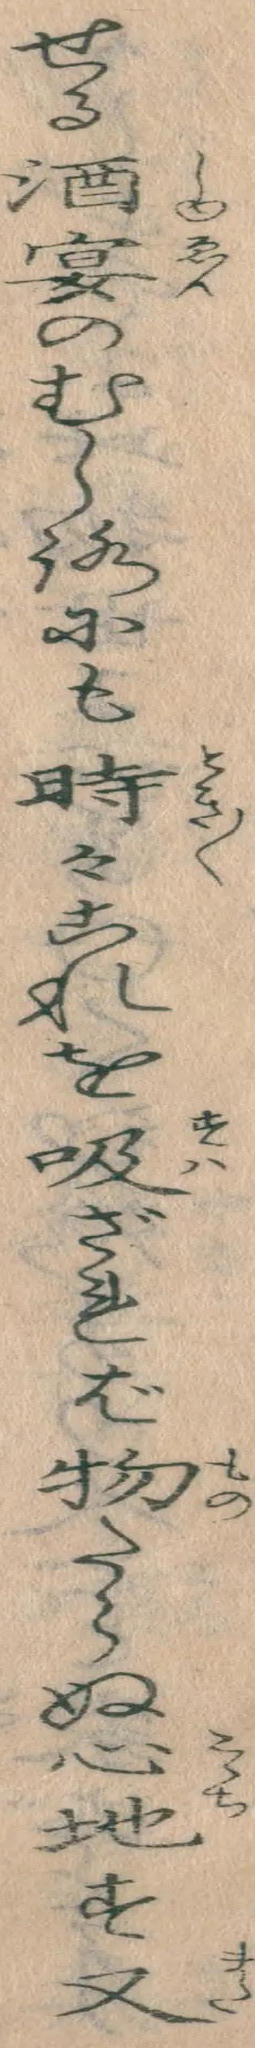せる酒宴のむしろにも時々これを吸ざれば物たらぬ心地す又
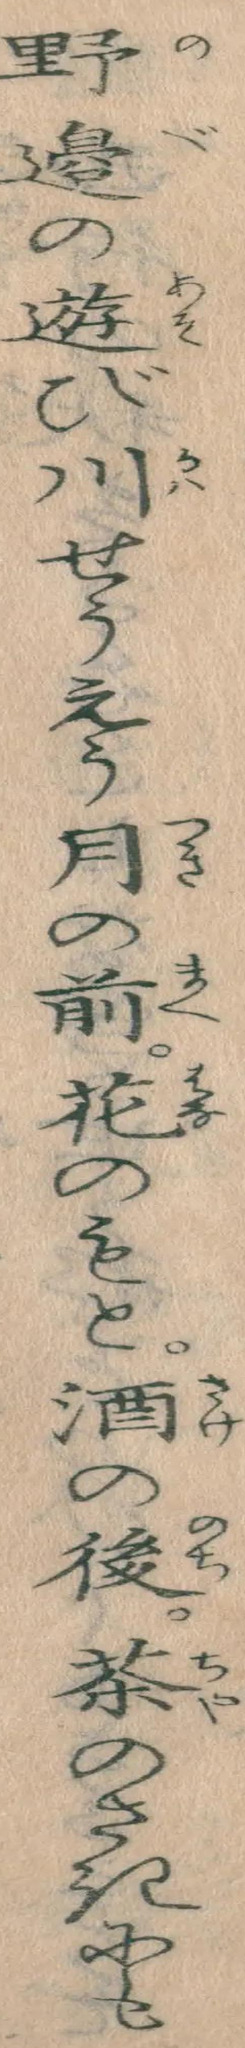野辺の遊び川せうえう月の前。花のもと。酒の後。茶のさきにも
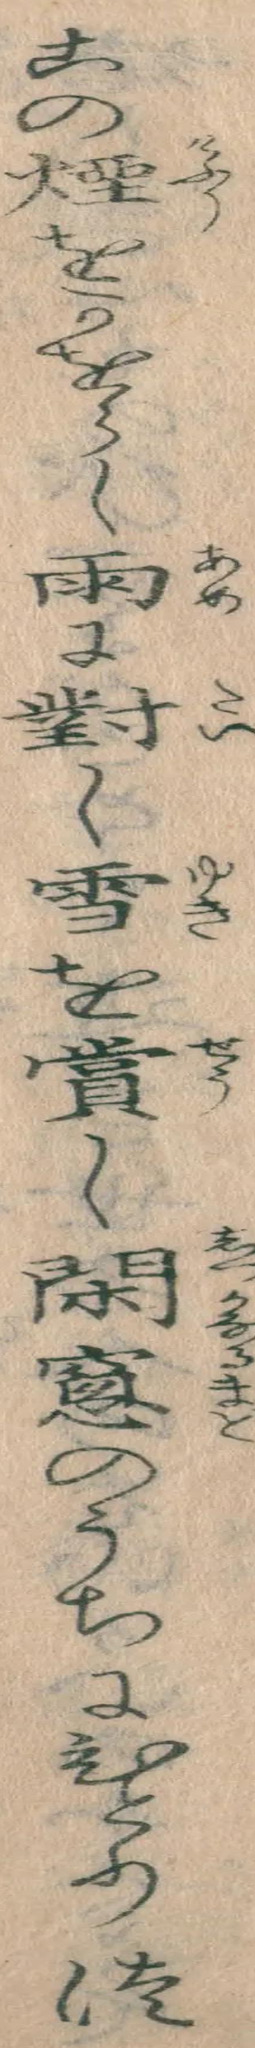この煙をかをらし雨に対し雪を賞し閑窓のうちにひとりつ
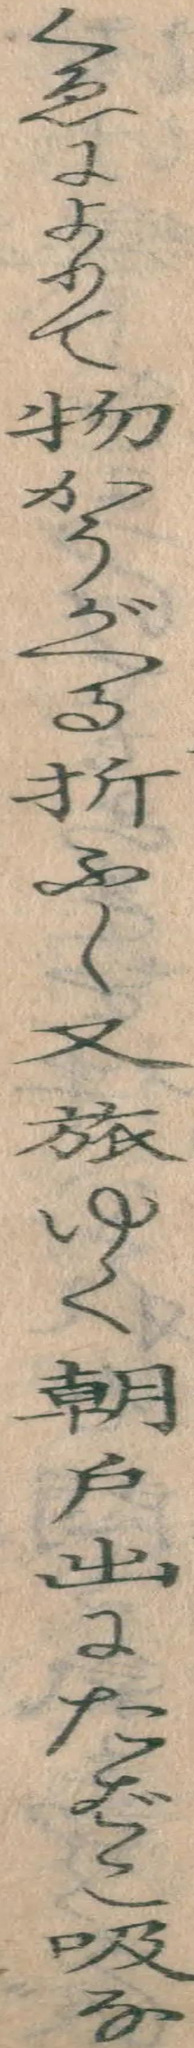くゑによりて物かうがへる折ふし又旅ゆく朝戸出にたばこ吸な
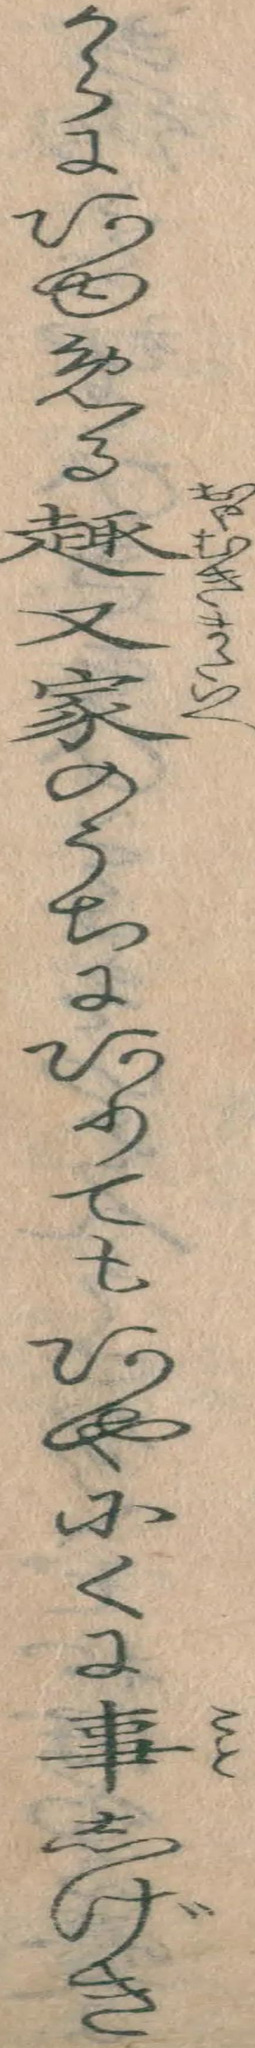からにあゆめる趣又家のうちにありてもあやにくに事しげき

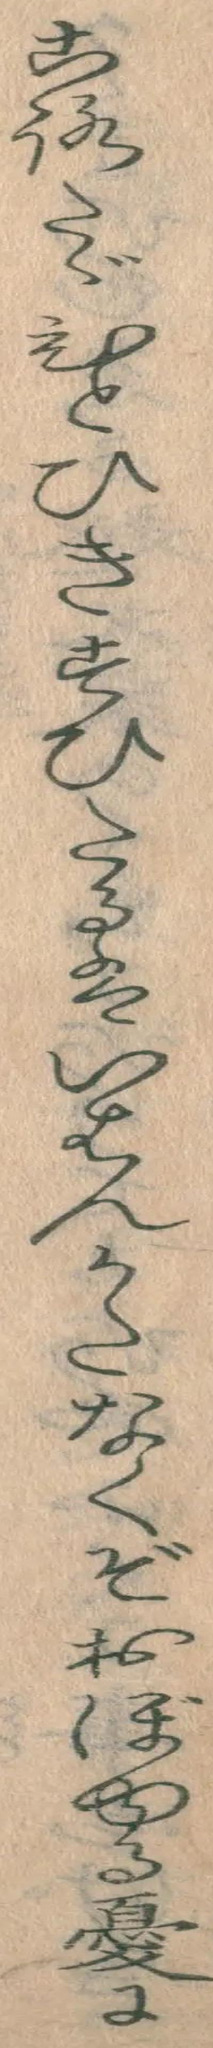ころたゞひとひきすひたるはいはんかたなくぞおぼゆる憂に
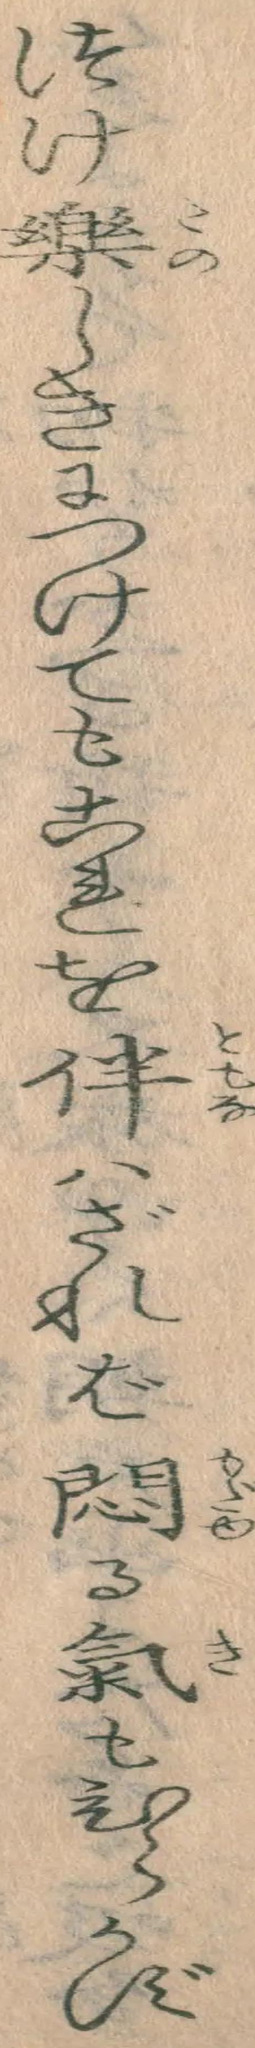つけ楽しきにつけてもこれを伴はざれば悶る気もひらかず
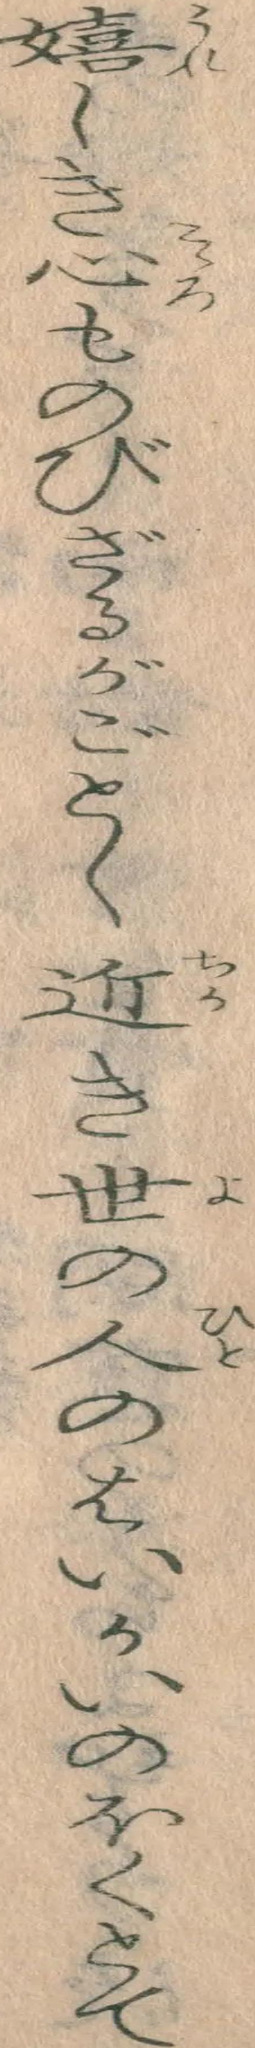嬉しき心ものびざるがごとし近き世の人のはいかいのほくとて
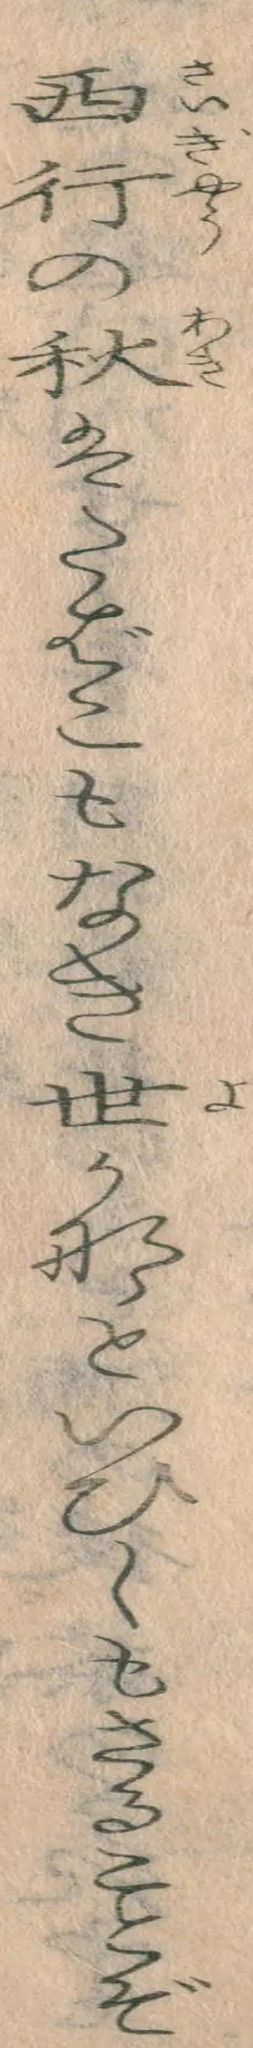西行の秋はたばこもなき世かなといひしもさることぞ
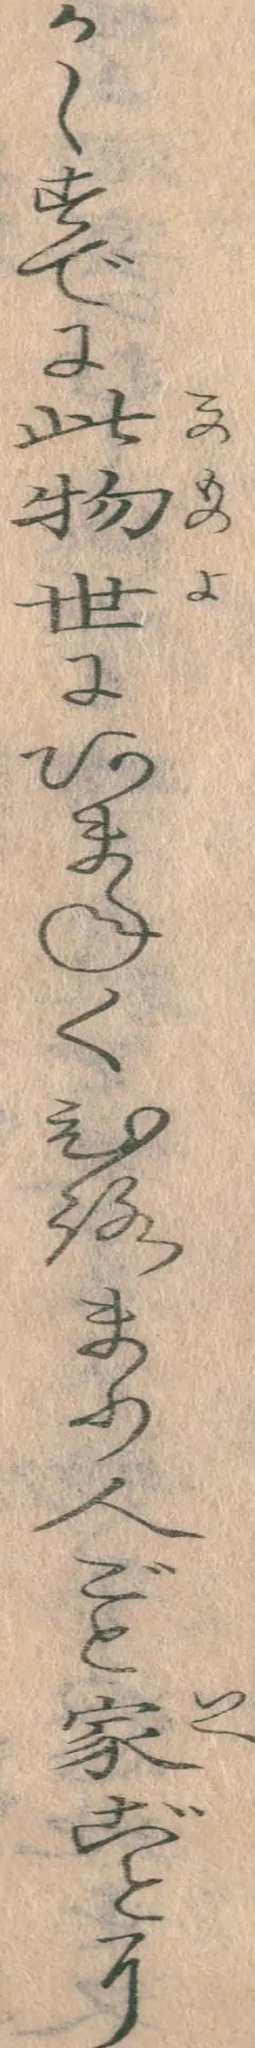かしすでに此物世にあまねくひろまり人ごと家ごとに
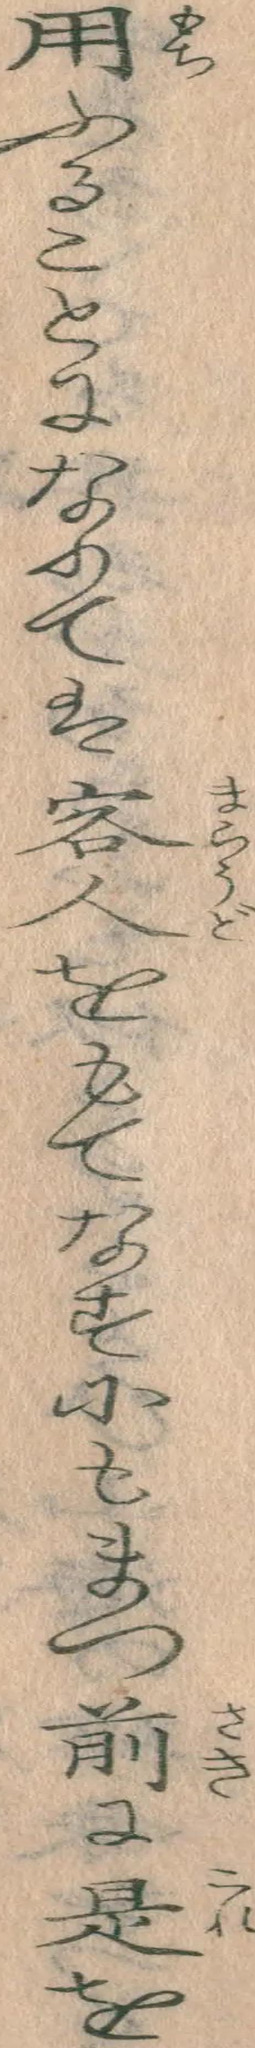用ふることになりては客人をもてなすにもまつ前に是を
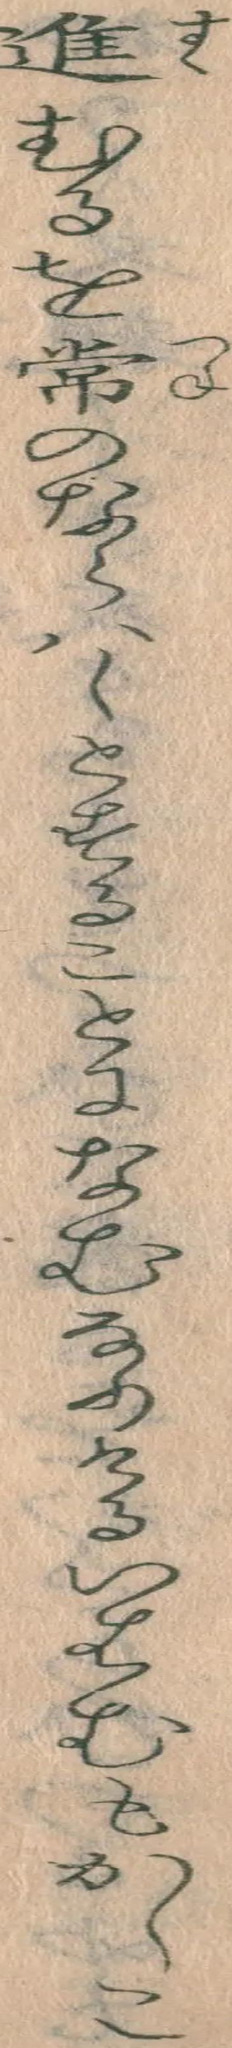進むるを常のならはしとすることになむなりけるいはむもかしこ
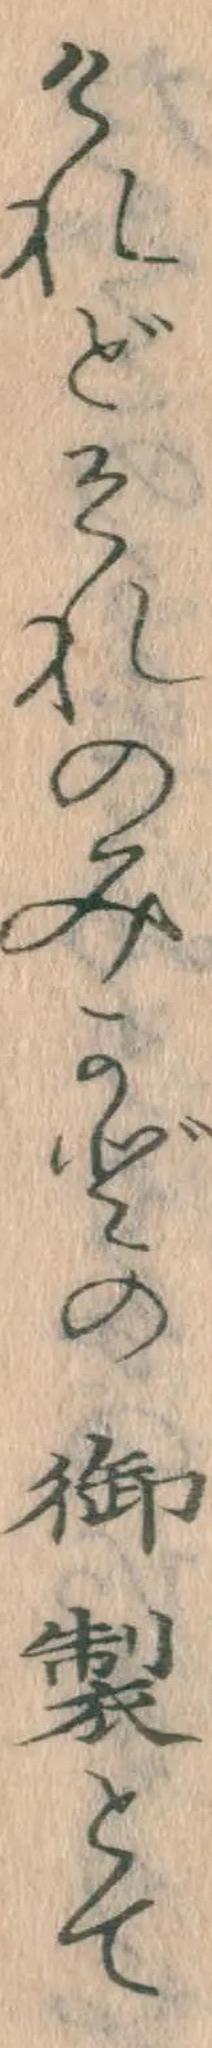けれどそれのみかどの御製とて
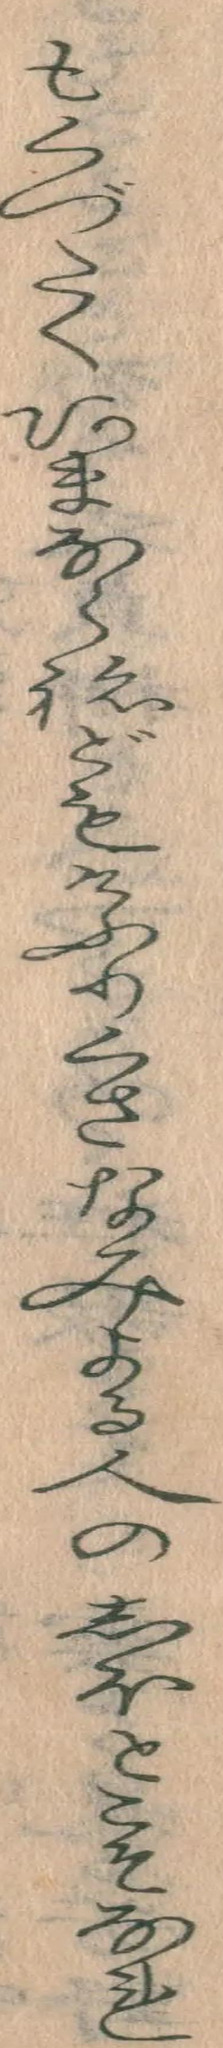もくづたくあまならねどもけふりくさなみよる人のしほとこそなれ
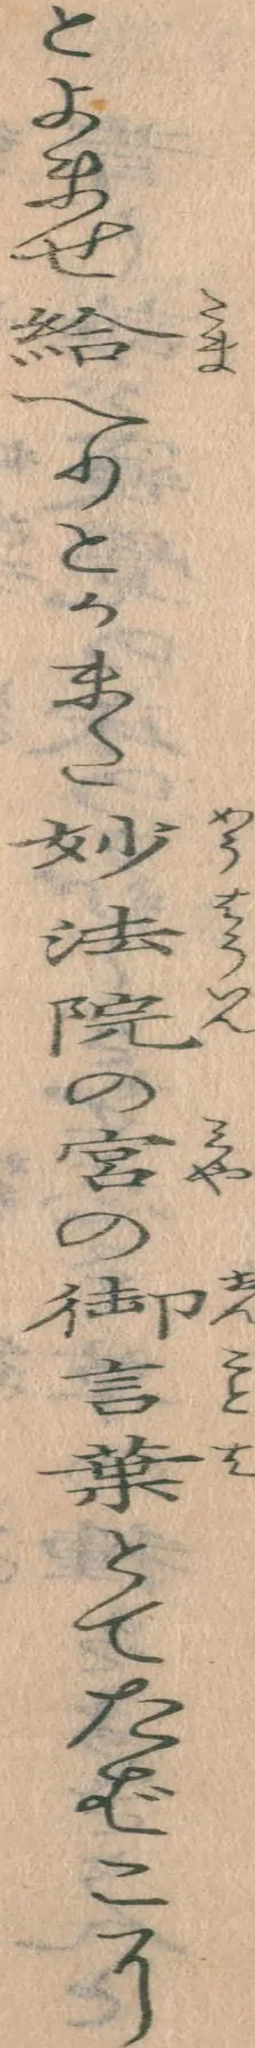とよませ給へりとかまた妙法院の宮の御言葉とてたばこに
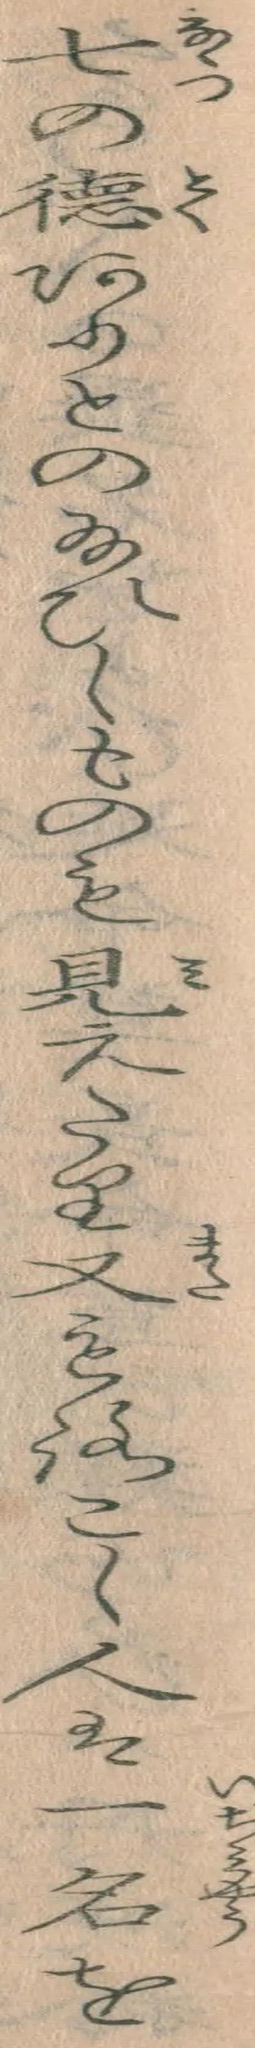七の徳ありとの給ひしものも見えたり又もろこし人は一名を
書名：目さまし草
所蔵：国立国会図書館 National Diet Library, JAPAN
